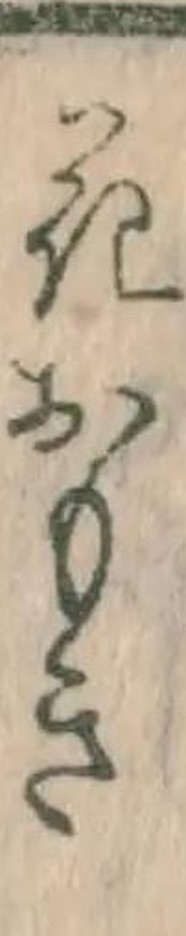花おもき
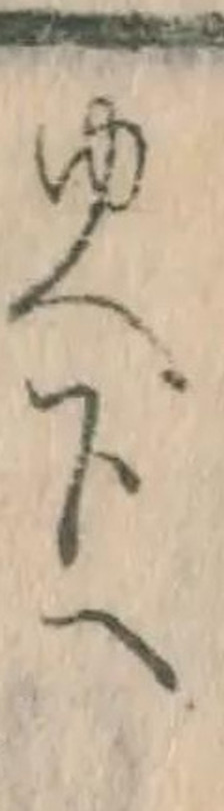ゆへ下へ
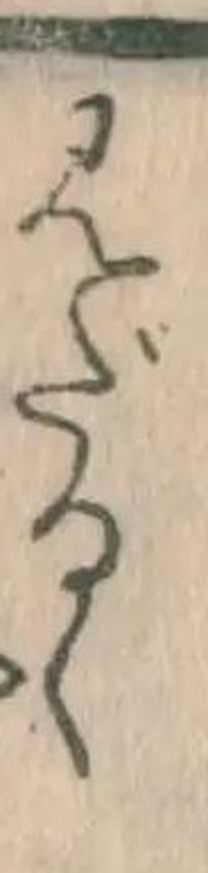見だるゝ
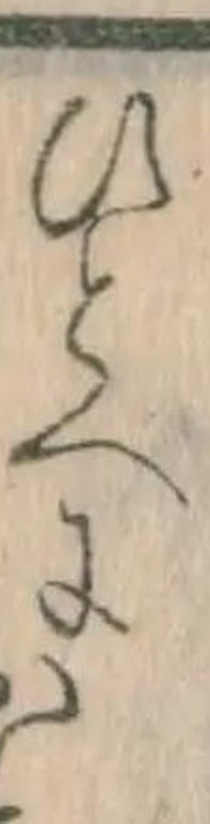ひとへに
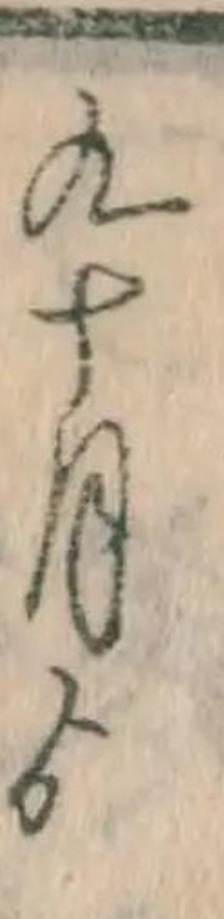九十月ゟ
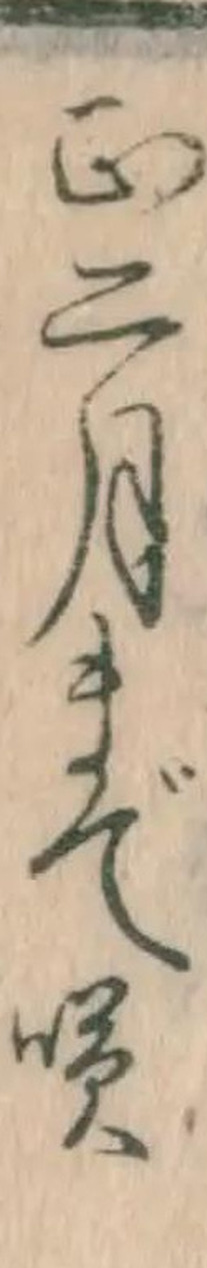正二月まで咲
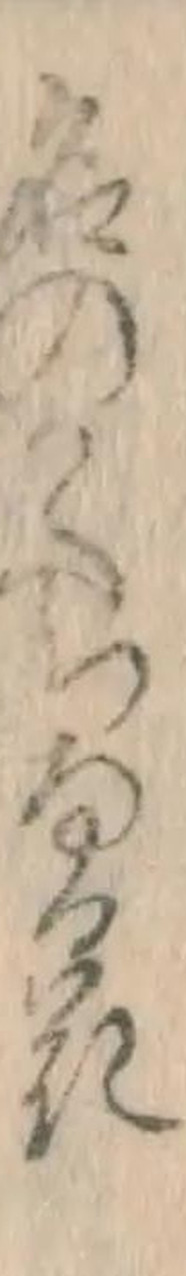名のかたちなる花
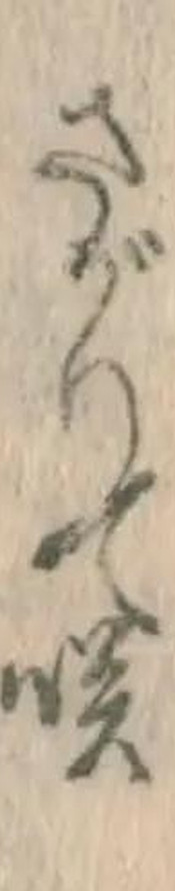さがりて咲
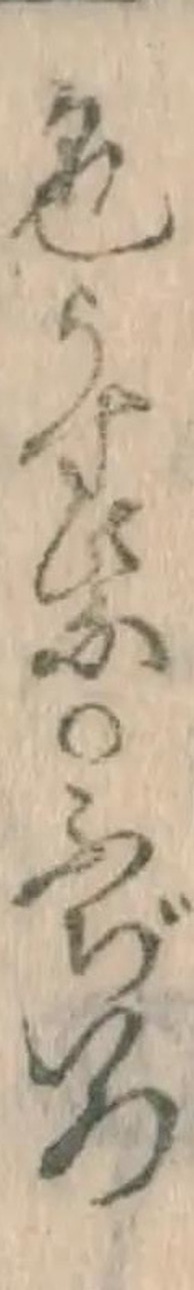色うす紫〇ふぢいろ
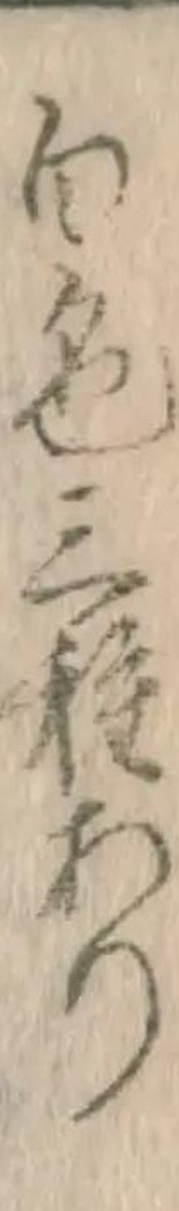白色三種あり
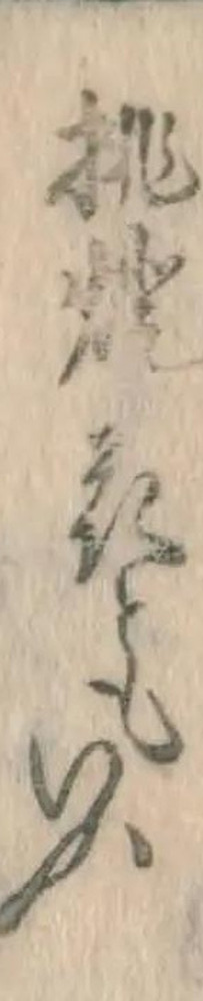桃燈花ともいふ

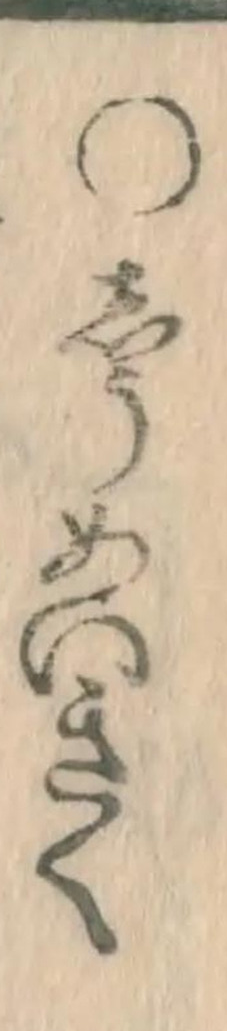〇しうめいきく
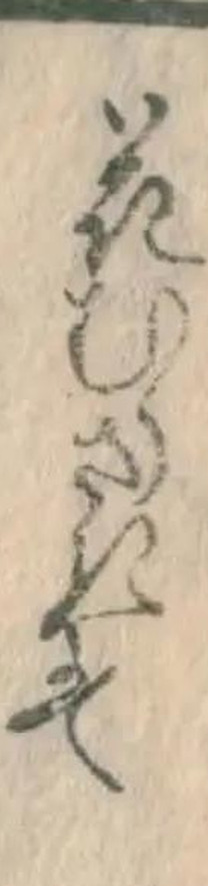花むらさきにて
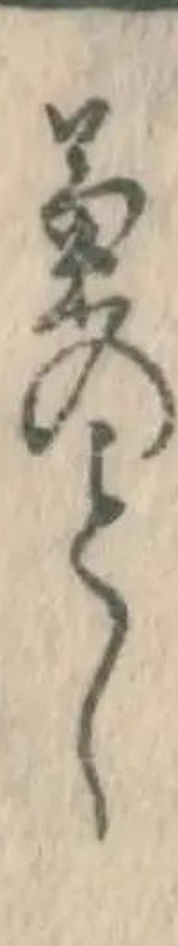菊のことく
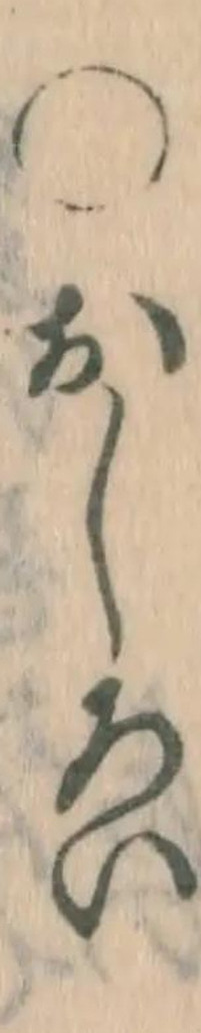〇おしろい
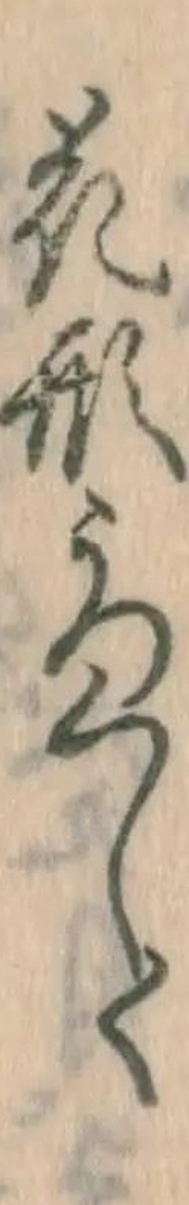花形うつくしく
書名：艸花繪前集. [3]
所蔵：国立国会図書館 National Diet Library, JAPAN
